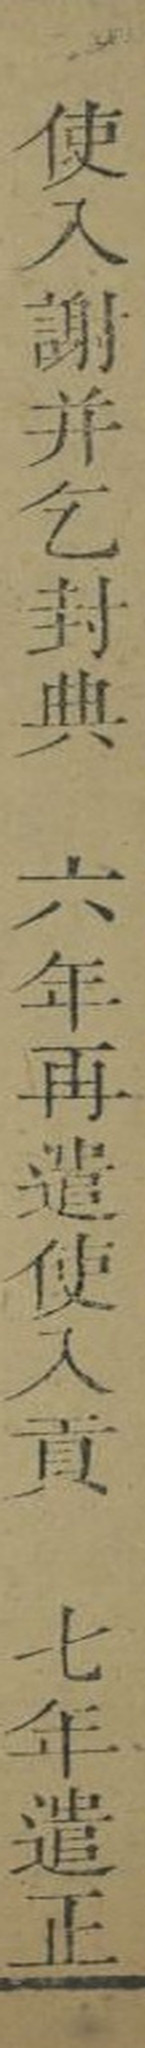使入謝并乞封典六年再遣使入貢七年遣正
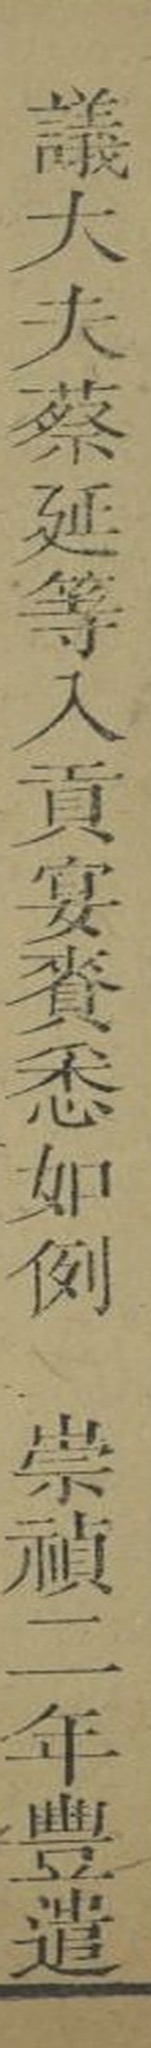議大夫蔡延等入貢宴賚悉如例崇禎二年豊遣
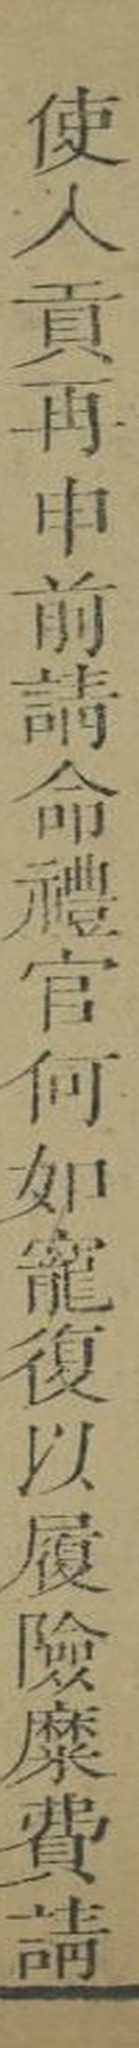使入貢再申前請命礼官何如寵復以履険糜費請
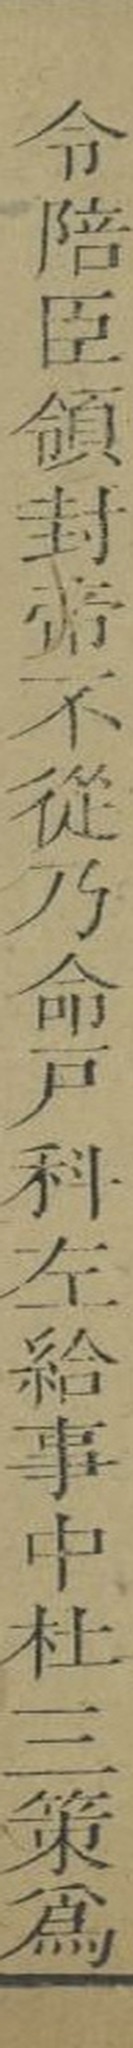令陪臣領封帝不従乃命戸科左給事中杜三策為
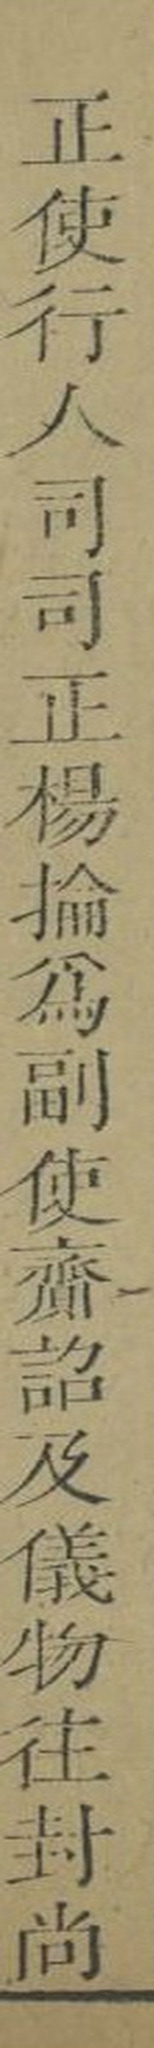正使行人司司正楊掄為副使齎詔及儀物往封尚
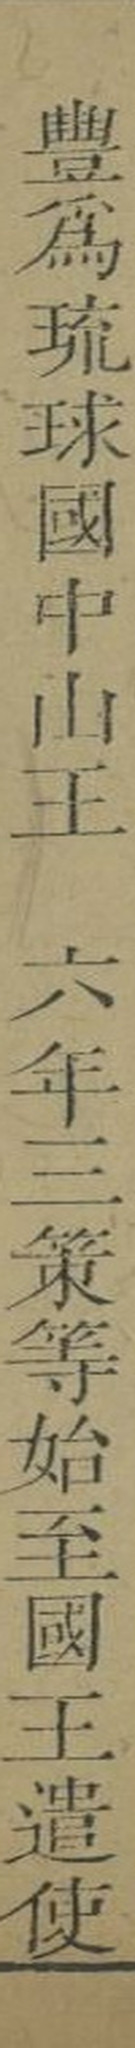豊為琉球国中山王六年三策等始至国王遣使
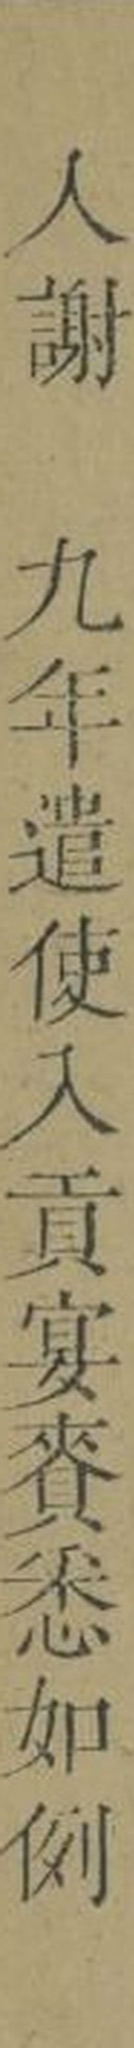入謝九年遣使入貢宴賚悉如例
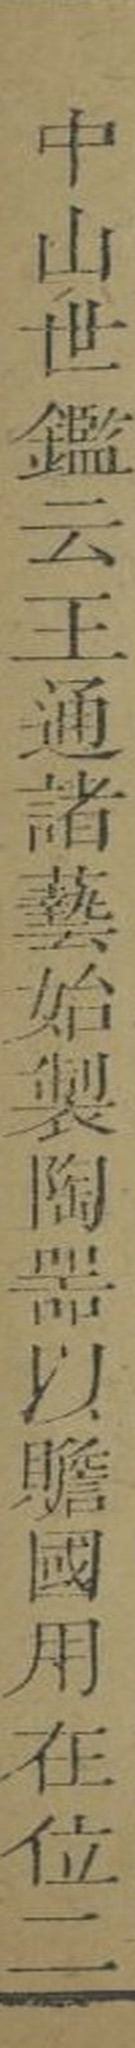中山世鑑云王通諸芸始製陶器以贍国用在位二

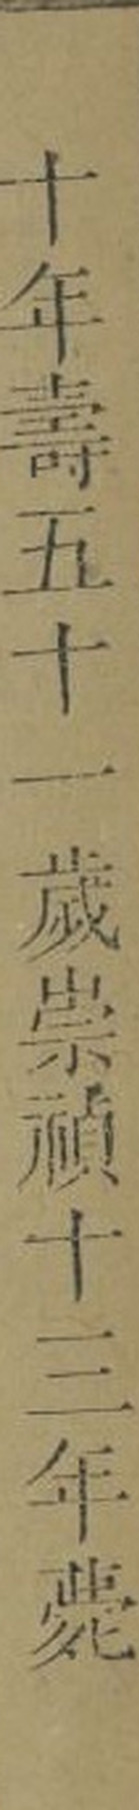十年寿五十一歳崇禎十三年薨
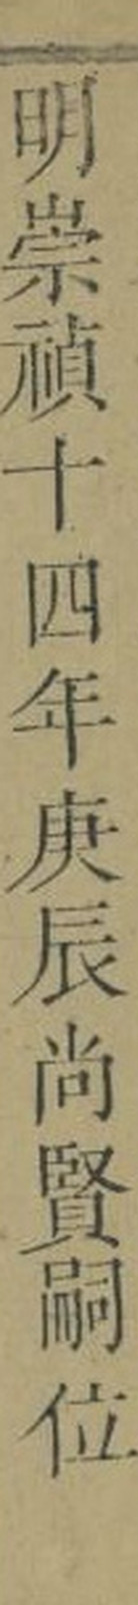明崇禎十四年庚辰尚賢嗣位
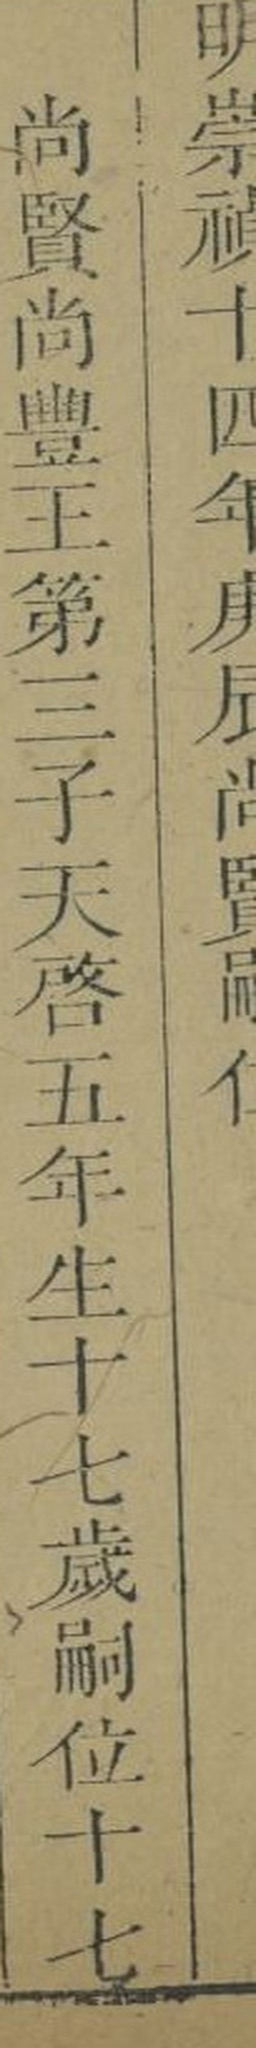尚賢尚豊王第三子天啓五年生十七歳嗣位十七
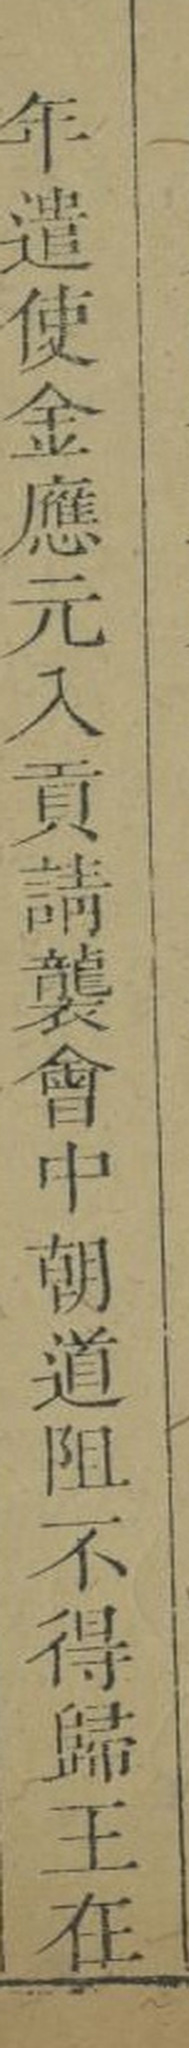年遣使金応元入貢請襲会中朝道阻不得帰王在
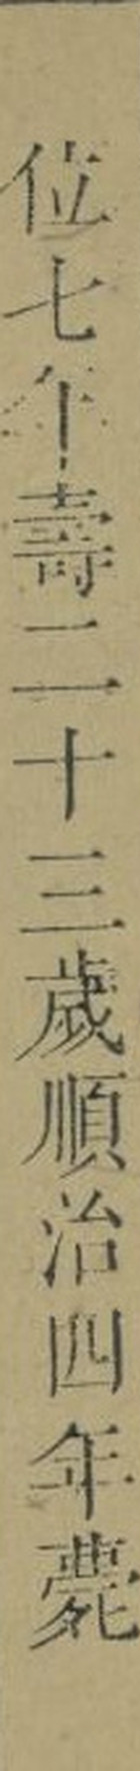位七年寿二十三歳順治四年薨
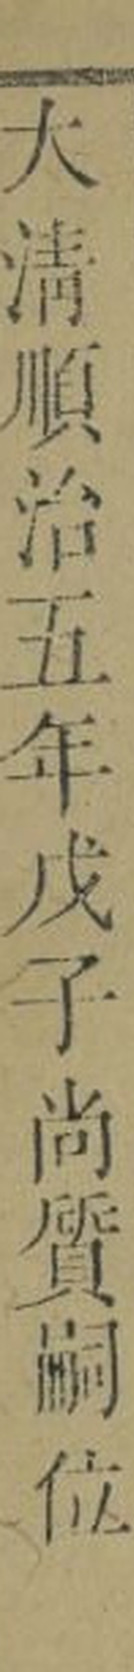大清順治五年戌子尚質嗣位
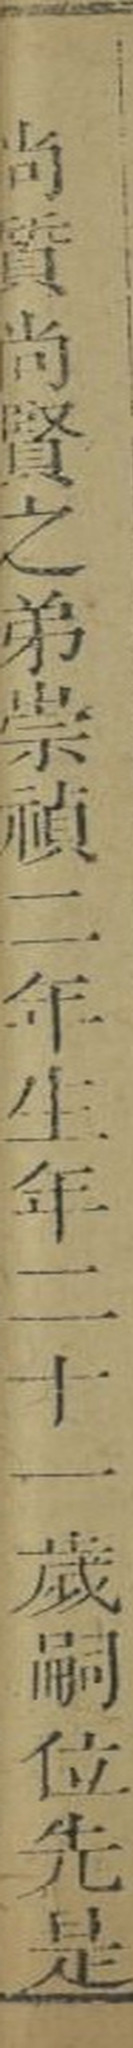尚質尚賢之弟崇禎二年生年二十一歳嗣位先是
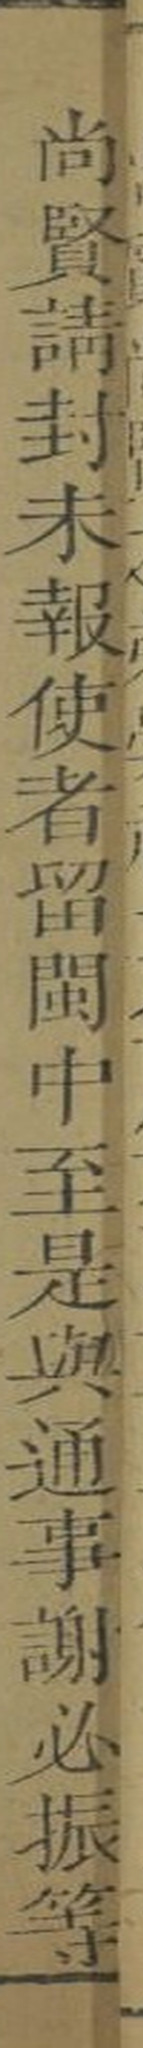尚賢請封未報使者留閩中至是与通事謝必振等
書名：中山伝信録 巻四
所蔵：University of the Ryukyus Library
